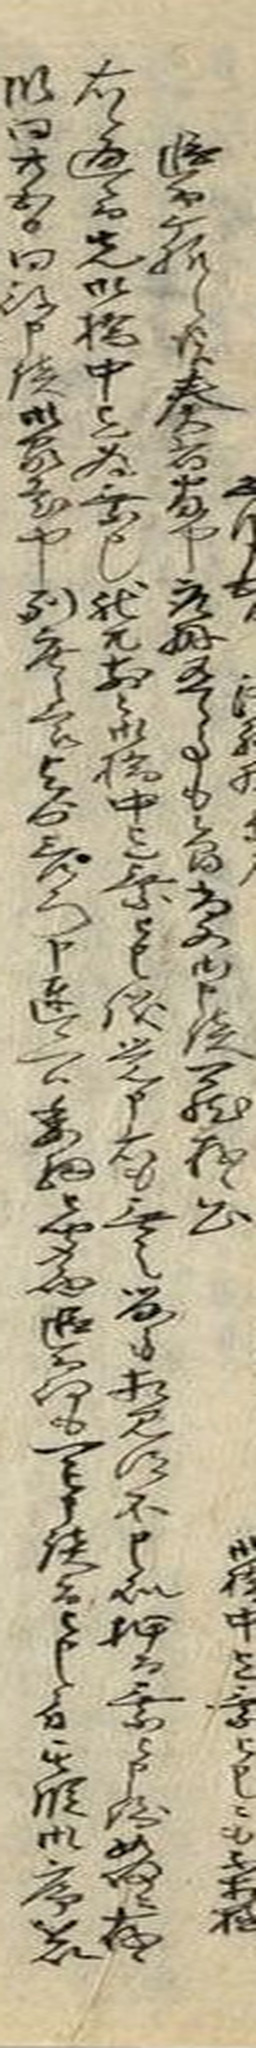段同廿五日同役申談御家老中列座之節与右衛門三左衛門申達候へハ委細被聞届追而何も可被申談旨被申候ニ付其段御序を以
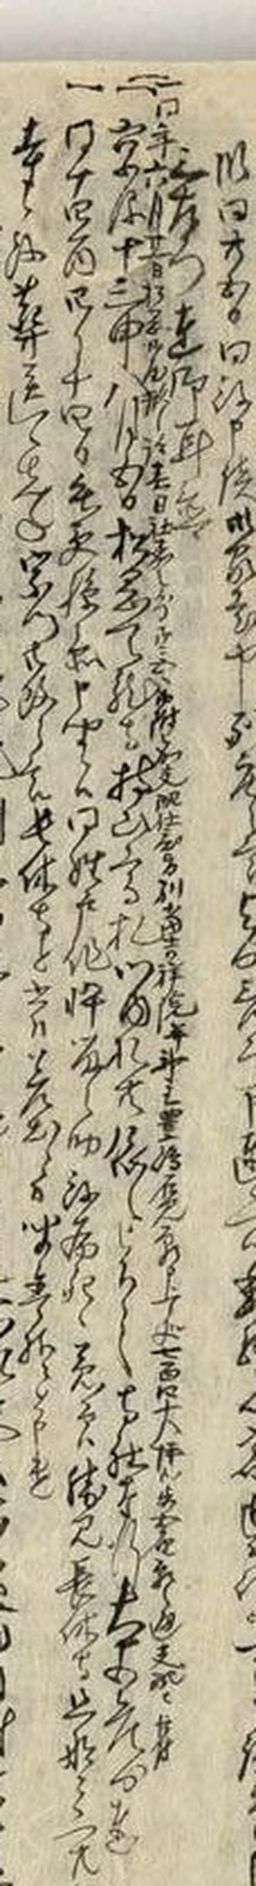一享保十三申八月五日松岡天龍寺持山高札御内札共依之被下之寺社奉行大宮彦右衛門ゟ達
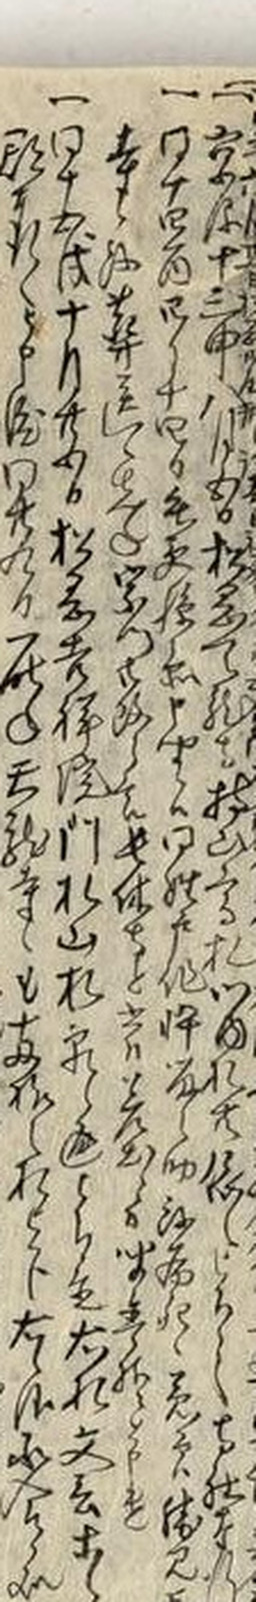寺へ致葬送候先年宗門御改之節長休寺と書付差出候ニ付聞置候様ニ被申遣
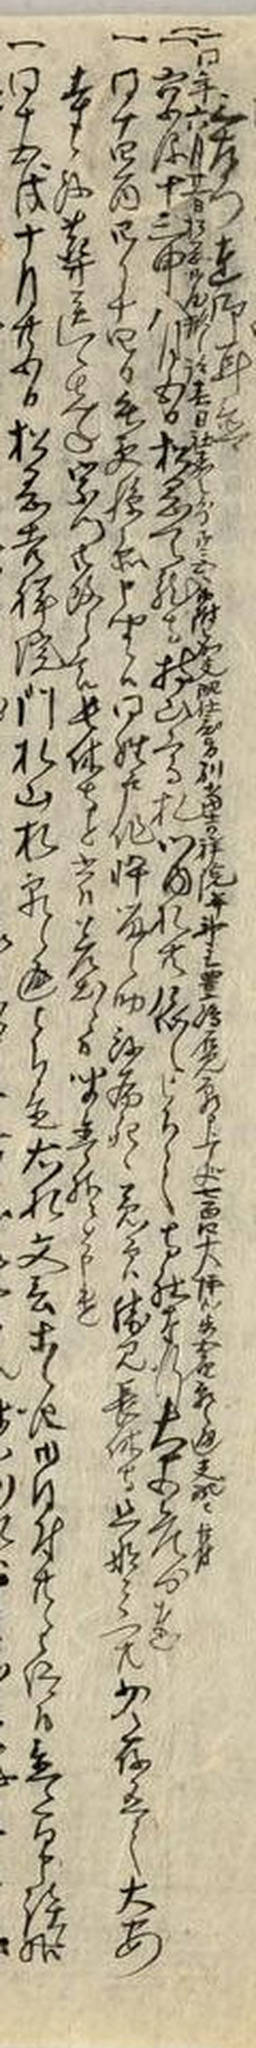一同十四酉四月十四日毛受孫兵衛申聞候ハ同姓戸作忰留之助致病死候兼而ハ勝見長休寺旦那ニ候へ共少々存有之大安
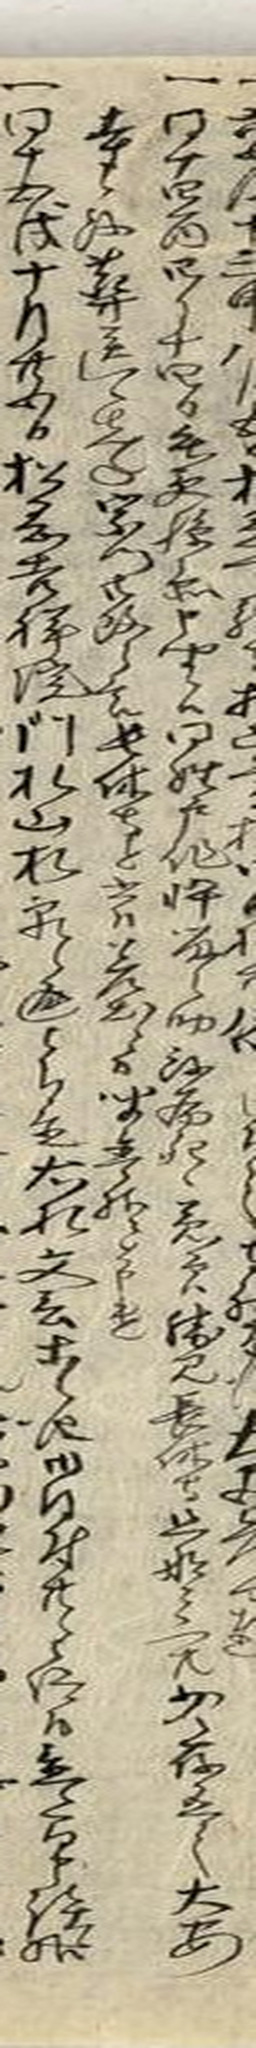一同十五戌十月廿五日松岡吉祥院門札山札願之通被下置右札文言等之儀御目付共へ被仰付置候間申談候様
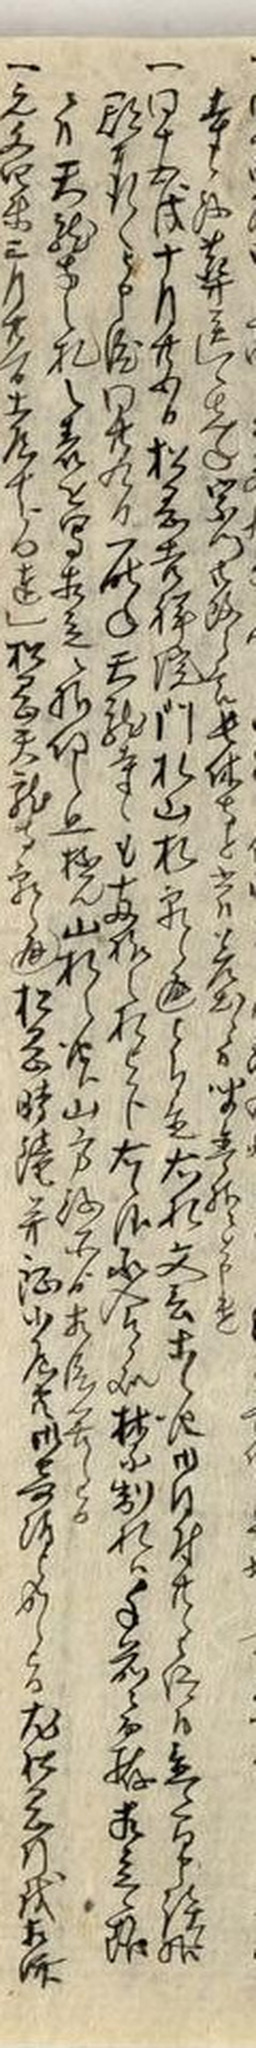郡奉行へ被申渡同廿九日一昨年天龍寺へも両様之札被下右之趣承合候処禁制札ハ手前ニ而拵相立候趣
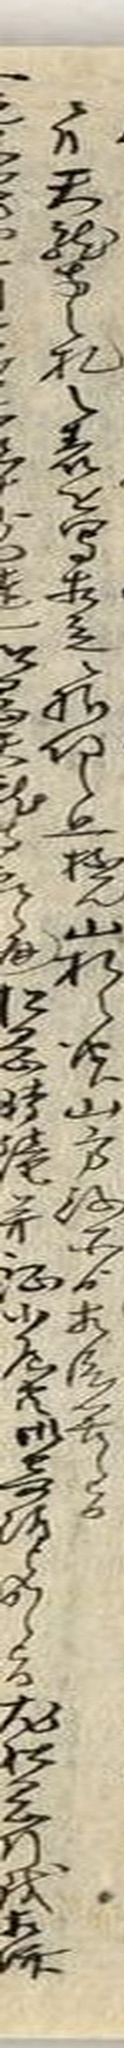一元文四未三月廿一日土屋十郎右衛門達」松岡天龍寺願之通松岡時鐘幷鉦小屋共御寄附被成候旨尤松岡引越相済
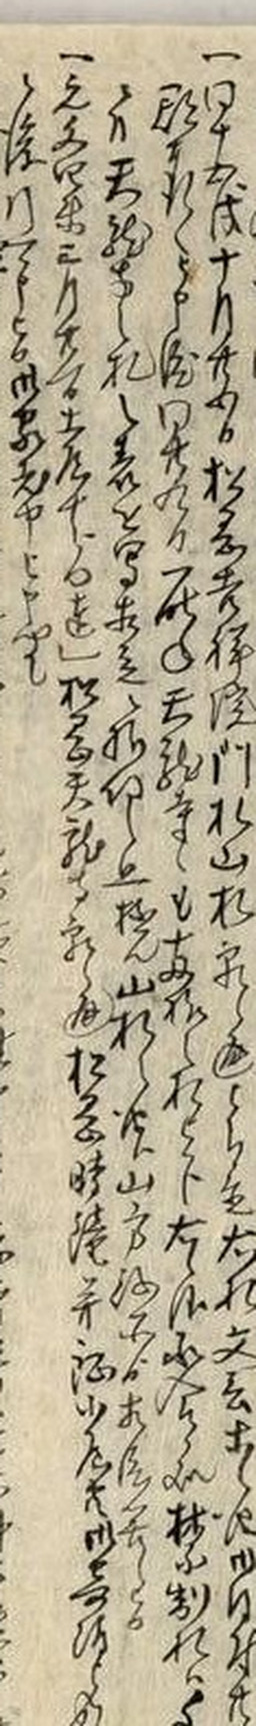ニ付天龍寺之札之表を写相立候様伺之上極ル山札之儀ハ山方役所ゟ相渡筈之旨
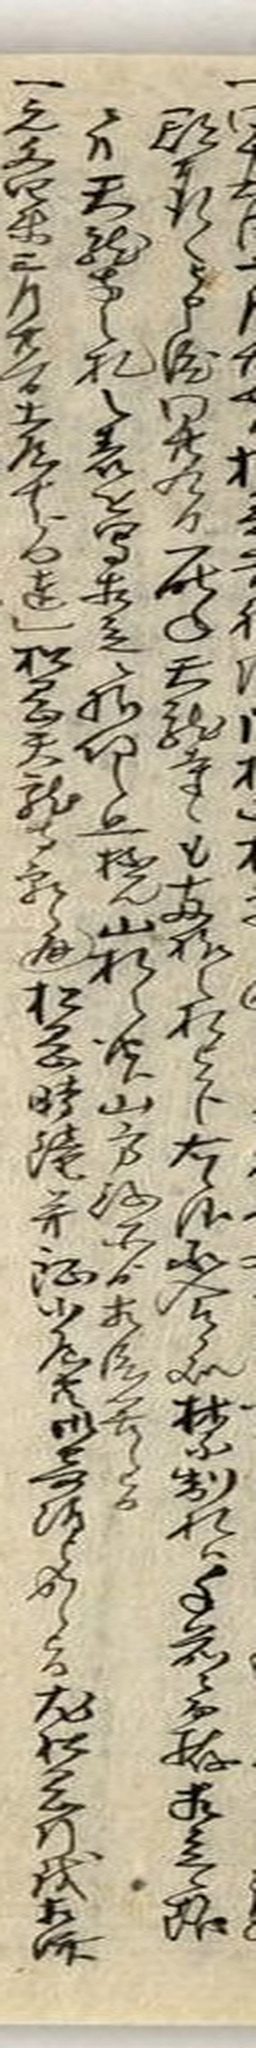一元文四未三月廿一日土屋十郎右衛門達」松岡天龍寺願之通松岡時鐘幷鉦小屋共御寄附被成候旨尤松岡引越相済
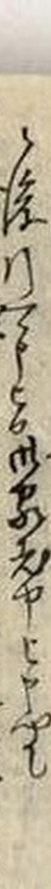候後引可申旨御家老中被申聞候
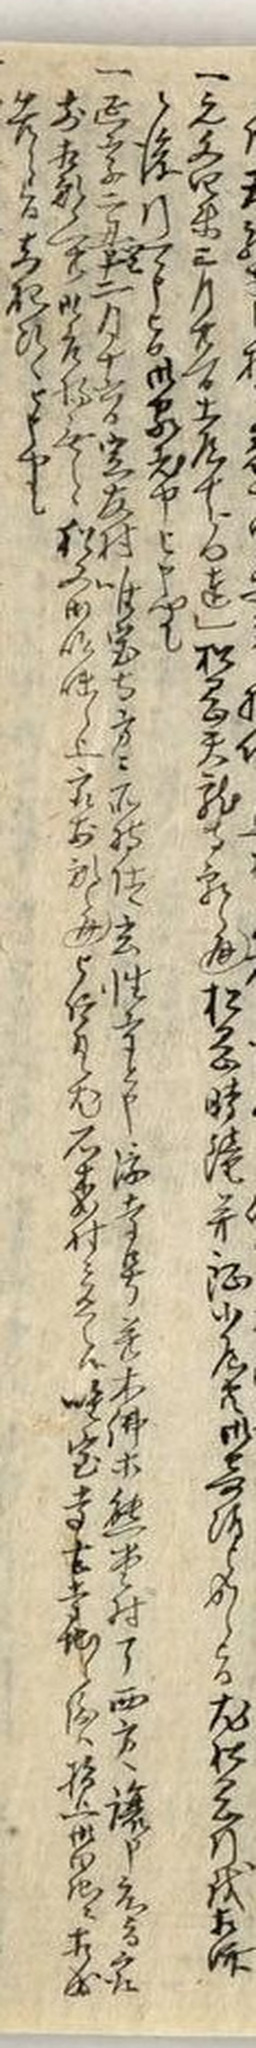一延享二丑閏十二月十六日定友村唯宝寺方ニ所持仕候玄性寺と申浮寺号幷木仏等熊堂村了西方へ譲申度旨最
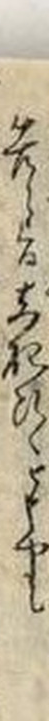筈之旨支配頭へ被申聞候

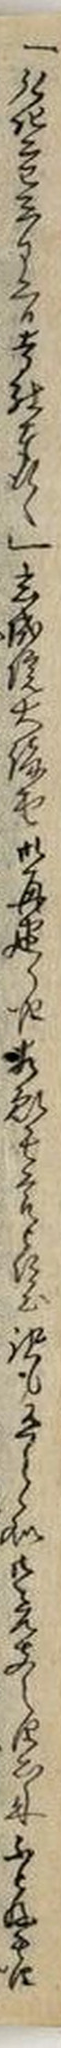一弘化二巳三月二日寺社奉行へ」玄成院大講堂御再建之儀相願其節被仰出訳も有之候処御差支之儀出来不被及其儀
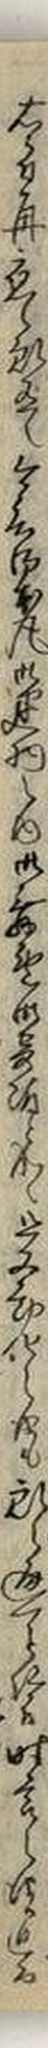右ニ付再応之願有之今度御本丸御建物之内御舞台御寄附被成候且又勧化之儀も願之通可被任ニ付時節之儀ハ追而
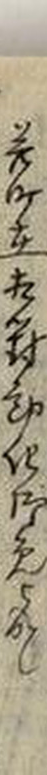幷町在相対勧化御免被成候
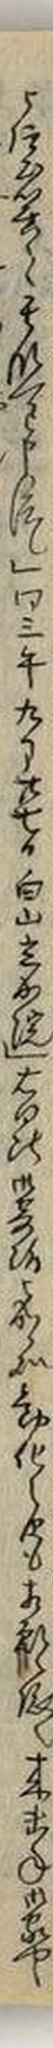被仰出筈候其段可被申渡候」同三午九月廿七日白山玄成院」右同断御寄附被成候処勧化之儀も相願候依之来未年御家中
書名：御国他国諸事之部
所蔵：福井県文書館 Fukui Prefectural Archives
